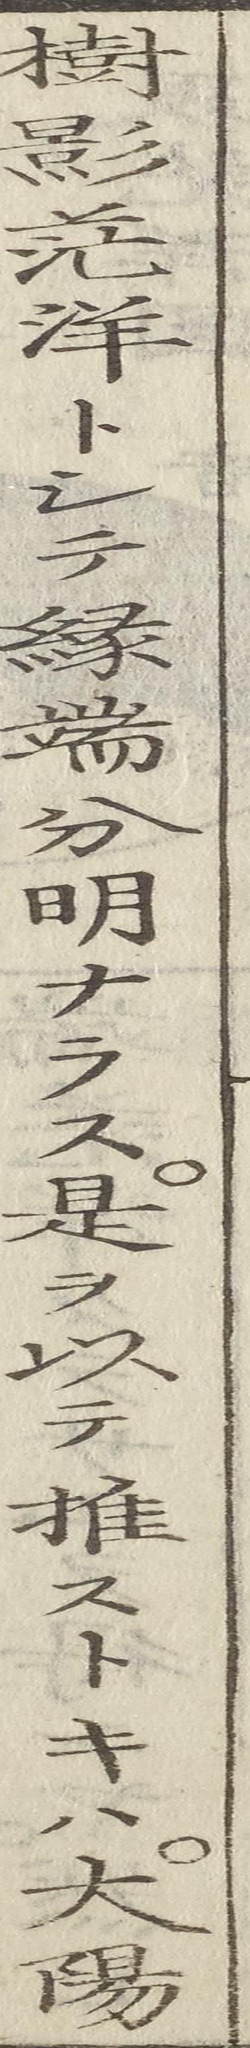樹影茫洋トシテ縁端分明ナラス。是ヲ以テ推ストキハ。大陽
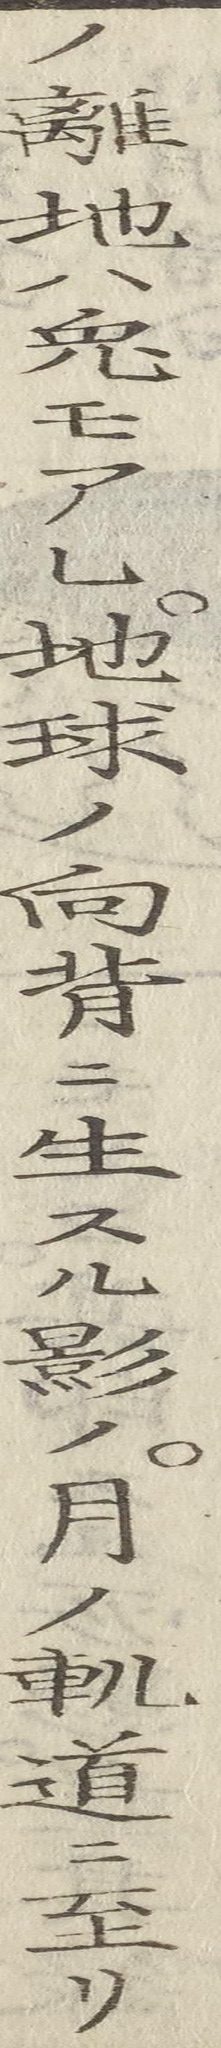ノ離地ハ免モアレ。地球ノ向背ニ生スル影ノ。月ノ軌道ニ至リ
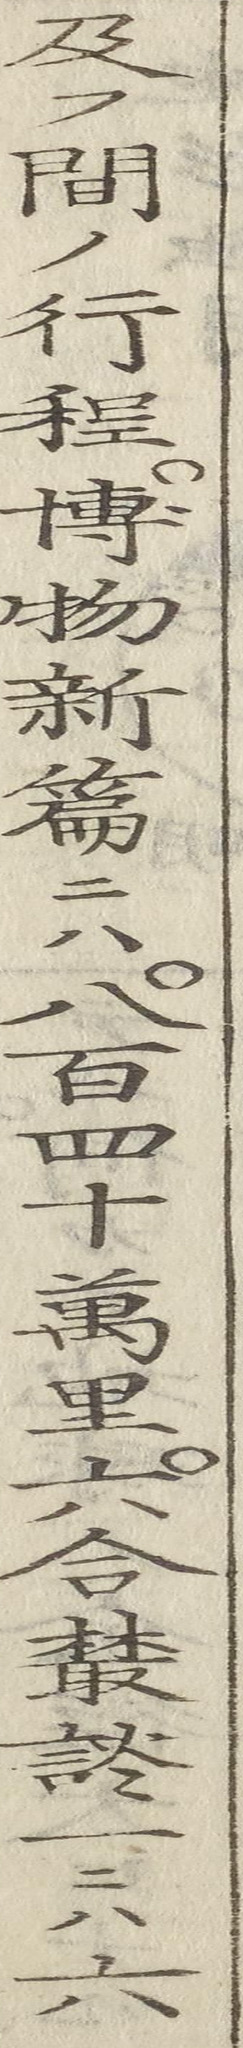及フ間ノ行程。博物新篇ニハ。八百四十万里。六合樷談一ニハ六
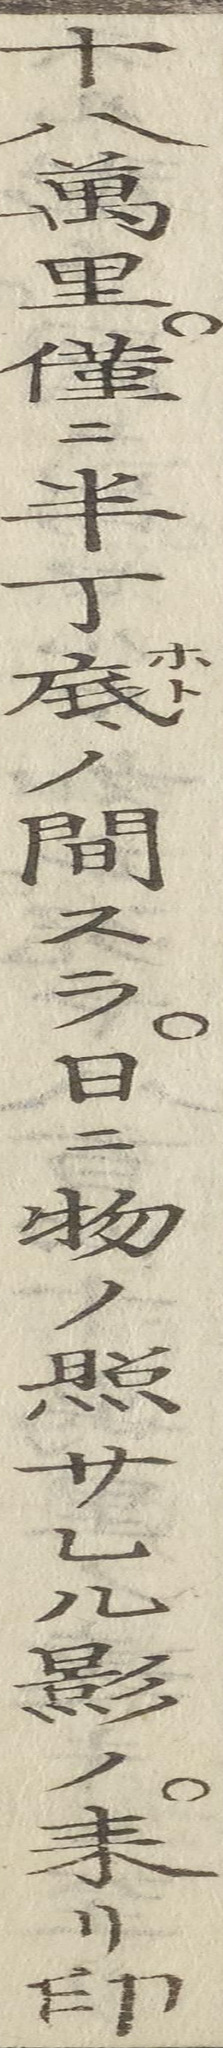十八万里。僅ニ半丁底ノ間スラ。日ニ物ノ照サレル影ノ。来リ印

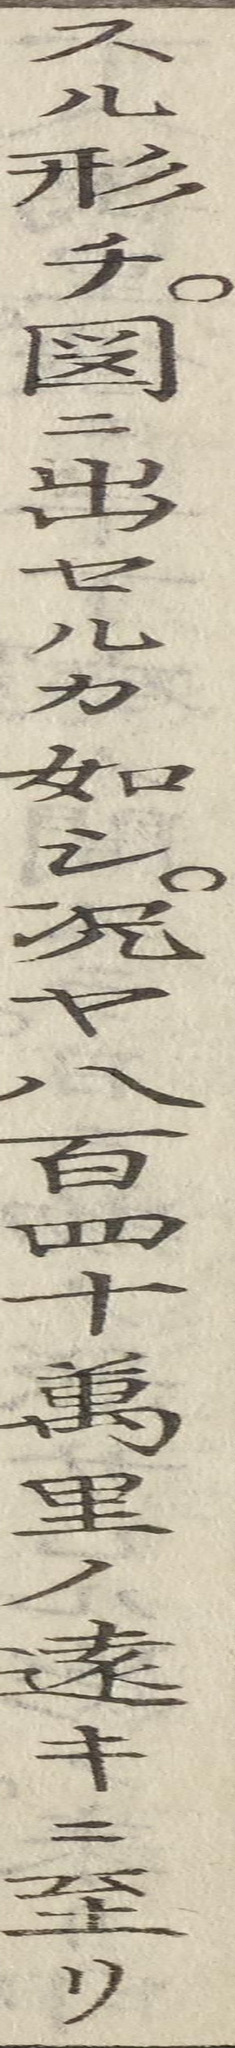スル形チ。図ニ出セルカ如シ。況ヤ八百四十万里ノ遠キニ至リ
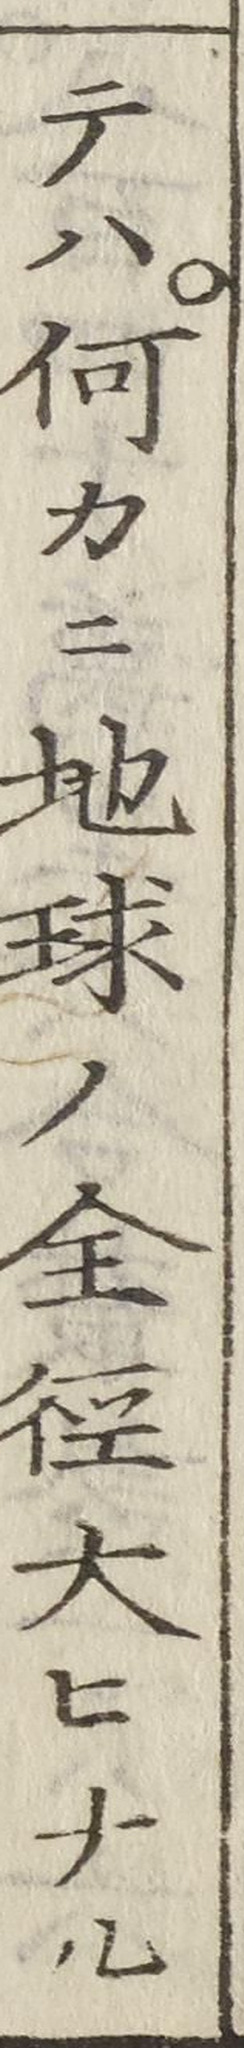テハ。何カニ地球ノ全径大ヒナル
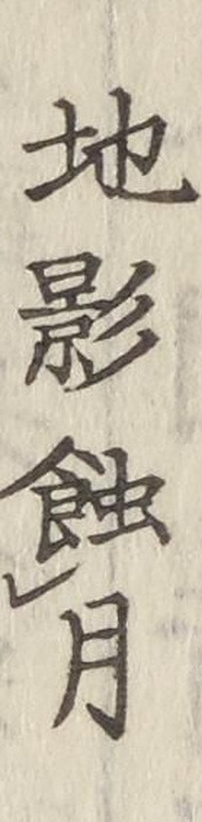地影蝕月
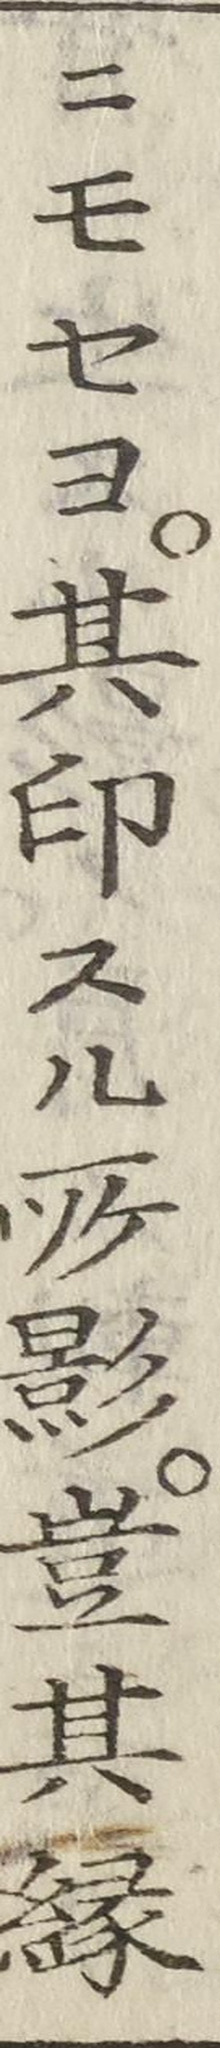ニモセヨ。其印スル所影。豈其縁
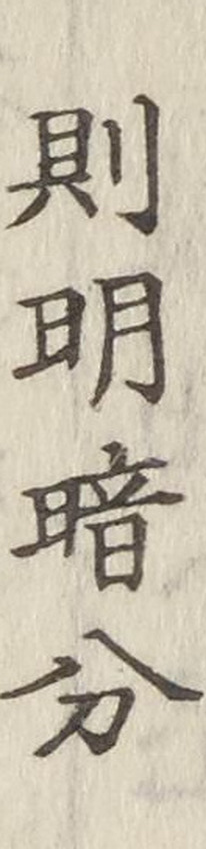則明暗分
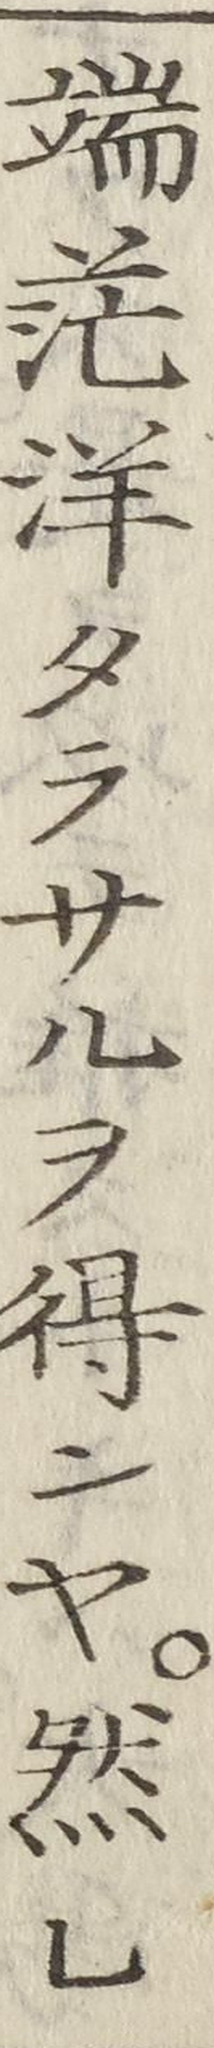端茫洋タラサルヲ得ンヤ。然レ
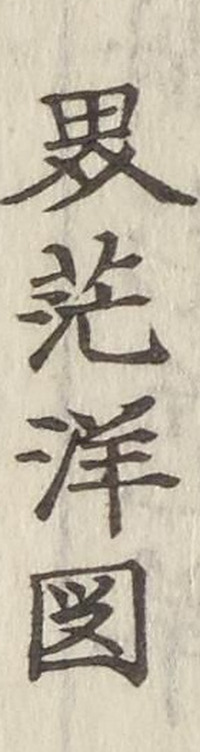界茫洋図
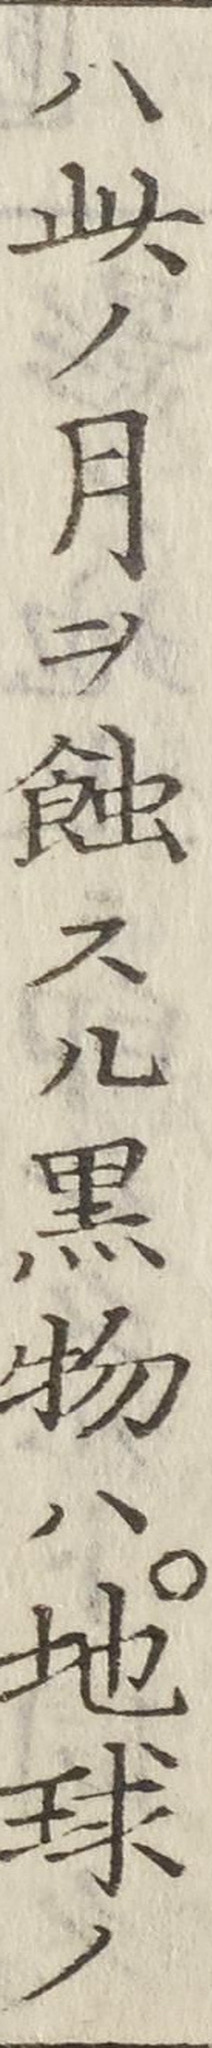ハ此ノ月ヲ蝕スル黒物ハ。地球ノ
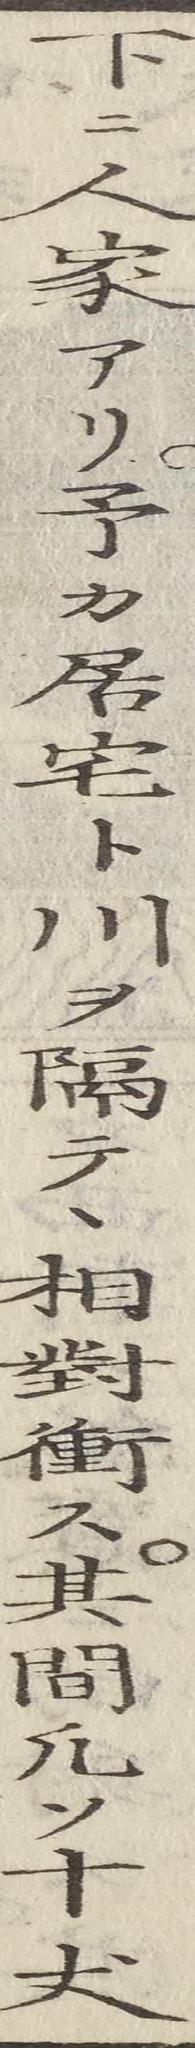下ニ人家アリ。予カ居宅ト用ヲ隔テヽ相対衝ス。其間凡ソ十丈
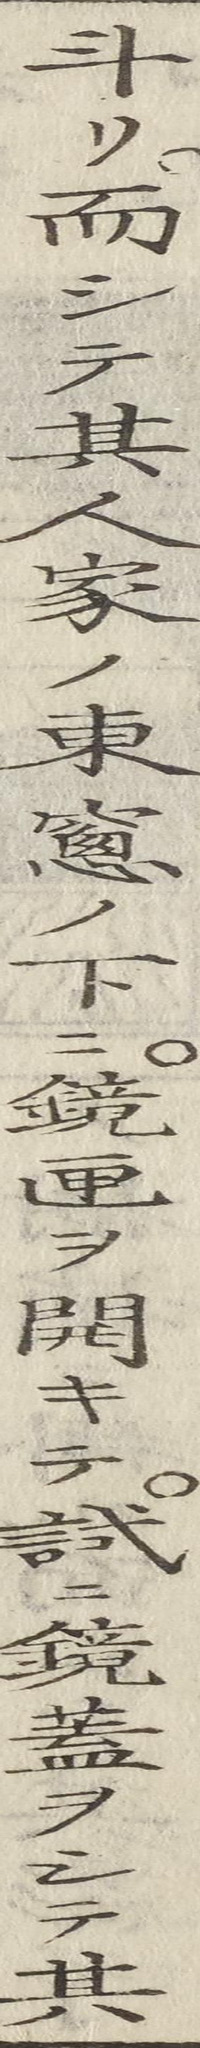斗リ。而シテ其人家ノ東窓ノ下ニ。鏡函ヲ開キテ。試ニ鏡蓋ヲシテ其
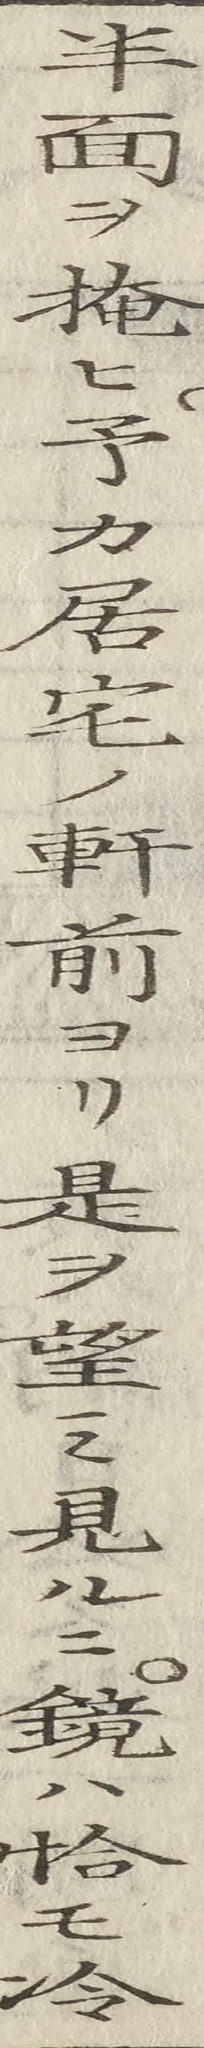半面ヲ掩ヒ。予カ居宅ノ軒前ヨリ是ヲ望ミ見ルニ。鏡ハ恰モ冷
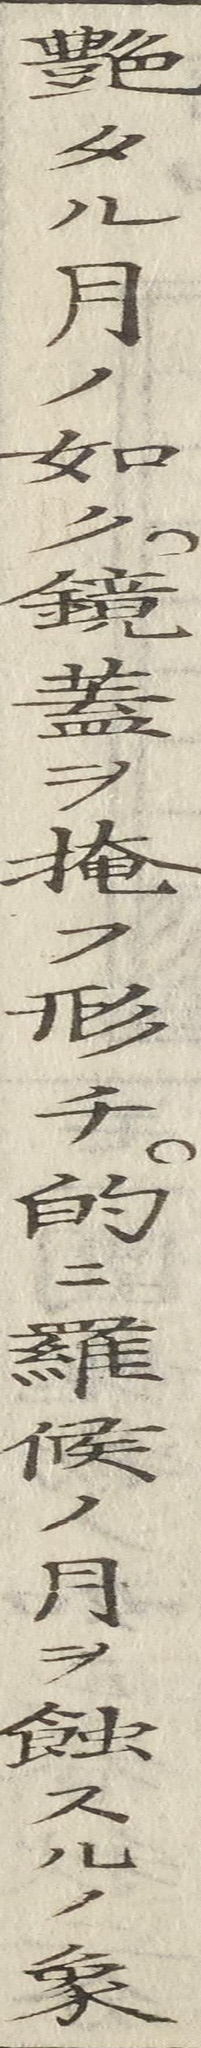艶タル月ノ如ク。鏡蓋ヲ掩フ形チ。的ニ羅候ノ月ヲ蝕スルノ象
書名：護法新論　中
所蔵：東京大学地震研究所図書室 Earthquake Research Institute Library, The University of Tokyo, JAPAN
